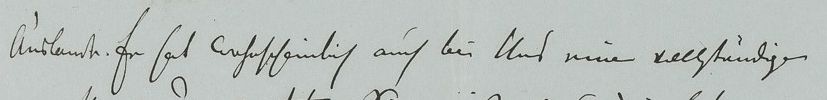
Auslande. Er hat wahrscheinlich auch bei Uns einen vollständigen
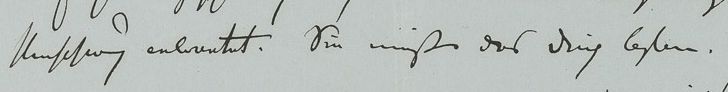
Umschwung erwartet. Sie müßen das Ding lesen.
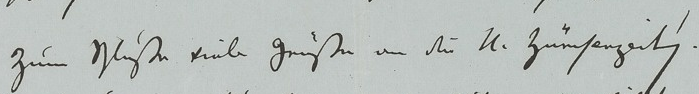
Zum Schluße viele Grüße an die N. Zürcherzeitung.
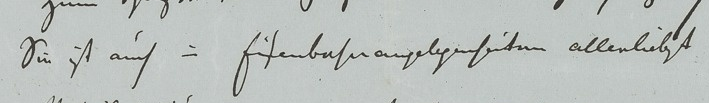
Sie ist auch in Eisenbahnangelegenheiten allerliebst.
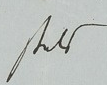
stets
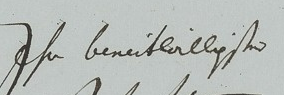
Ihr bereitwilligster
